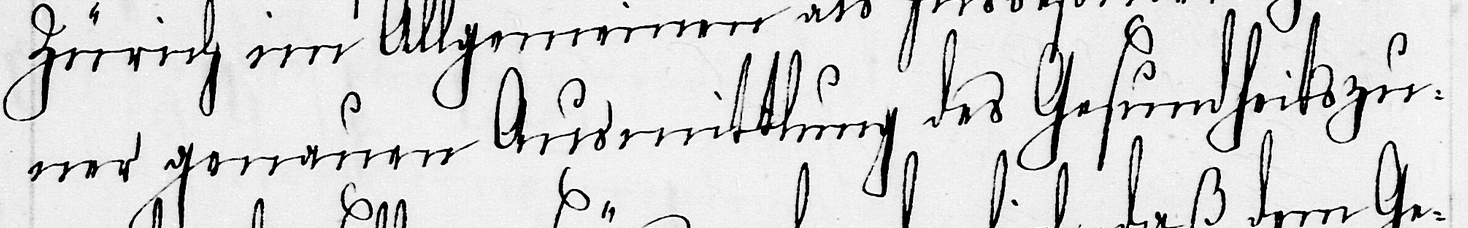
ner genauen Ausmittlung des Gesundheitszu¬
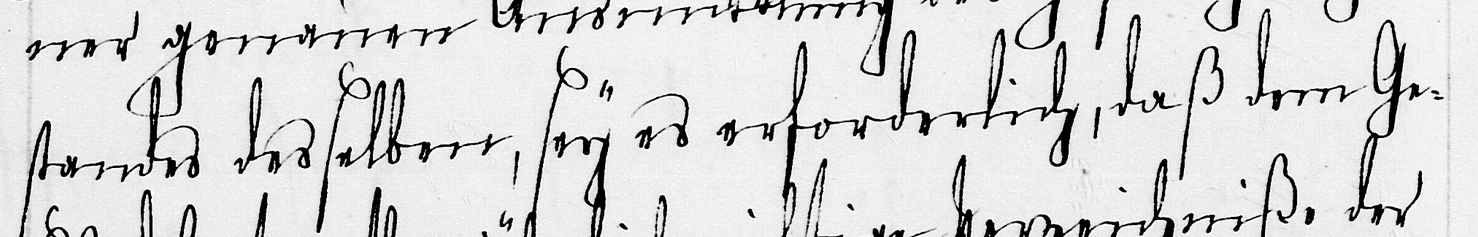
standes desselben, sey es erforderlich, daß dem Ge¬
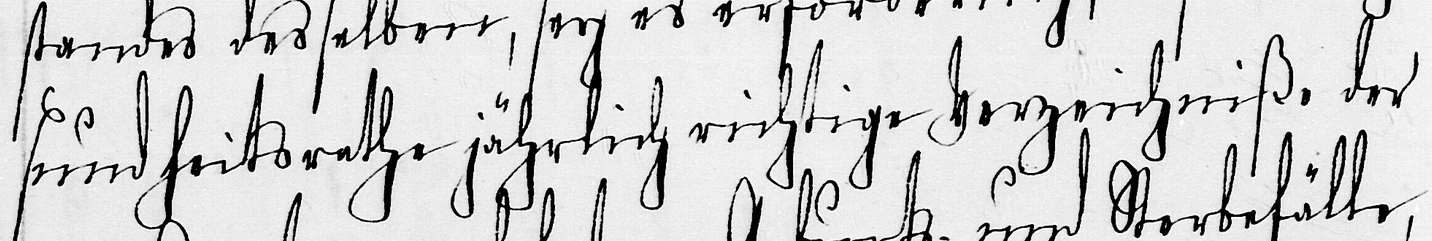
sundheitsrathe jährlich richtige Verzeichniße der
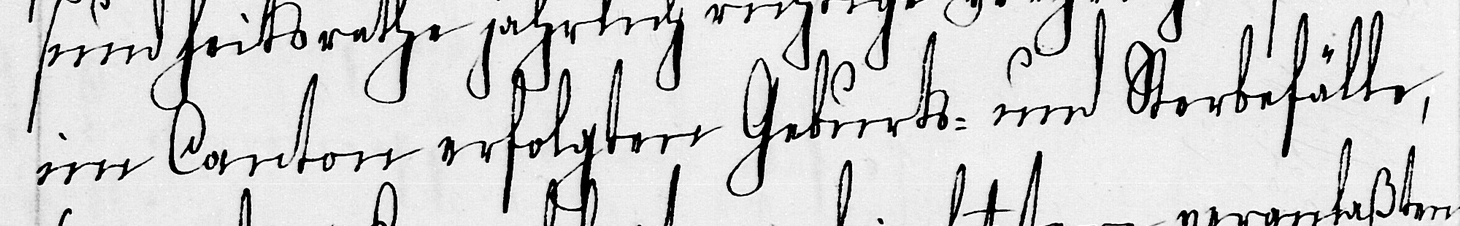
im Canton erfolgten Geburts- und Sterbefälle,
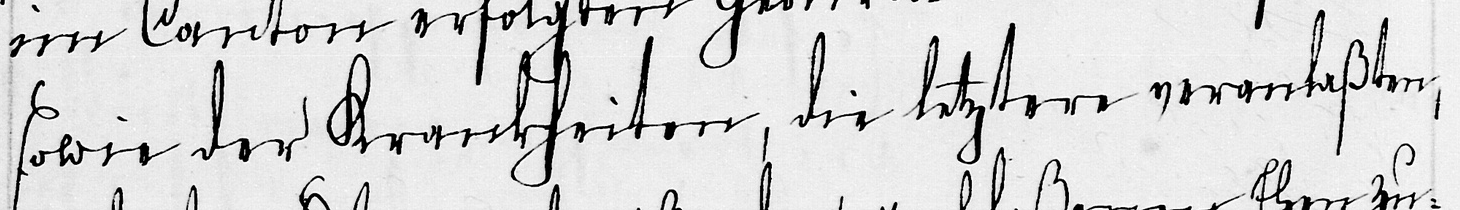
sowie der Krankheiten, die letztere veranlaßten,
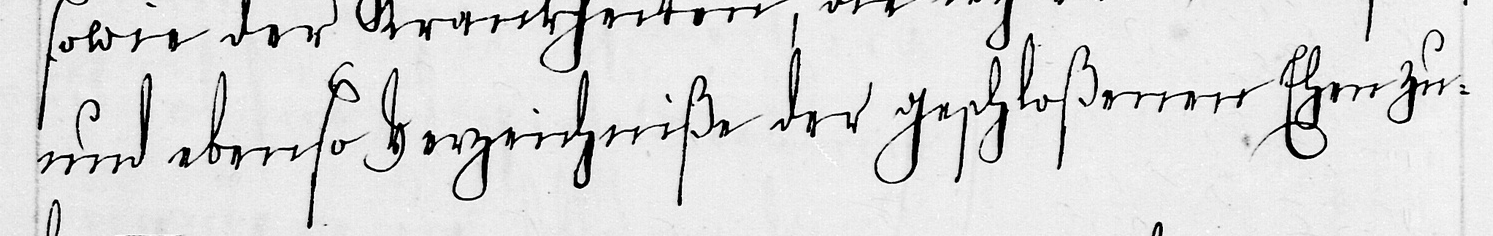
und ebenso Verzeichniße der geschloßenen Ehen zu¬
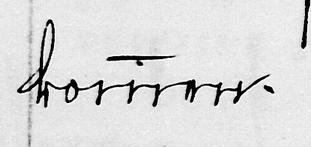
kommen.
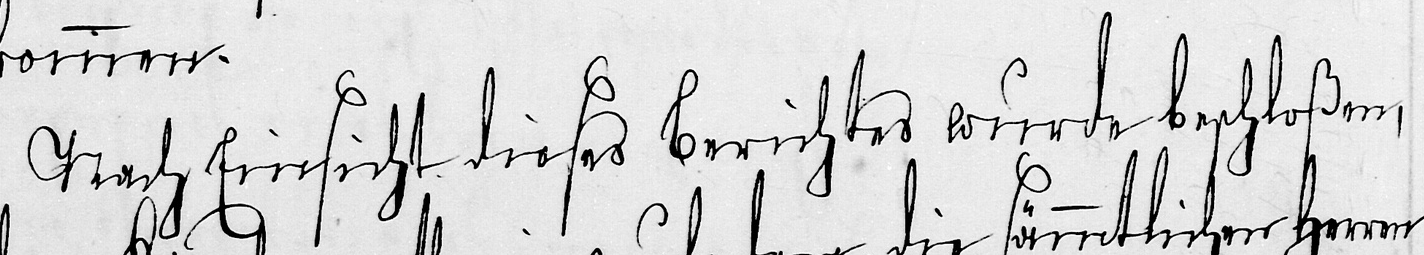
Nach Einsicht dieses Berichtes wurde beschloßen,
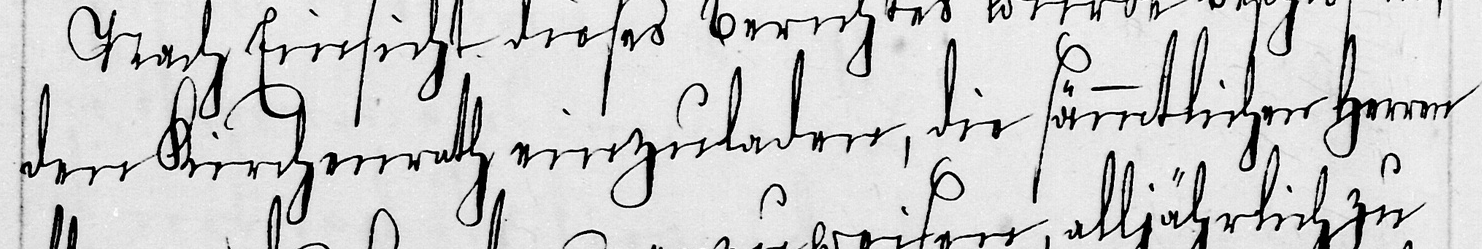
den Kirchenrath einzuladen, die sämmtlichen Herr¬
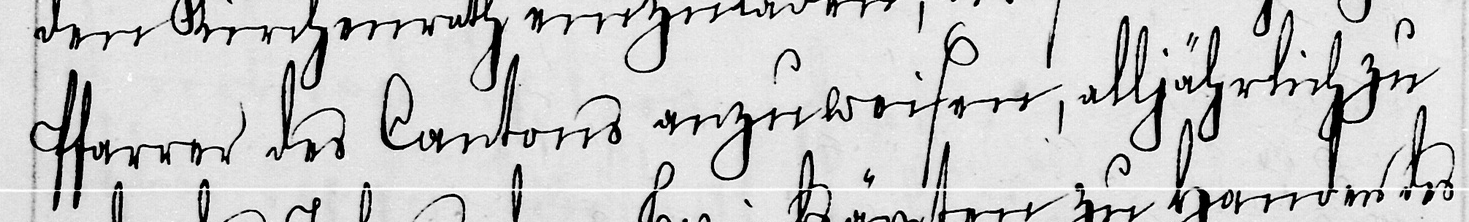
Pfarrer des Cantons anzuweisen, alljährlich zu
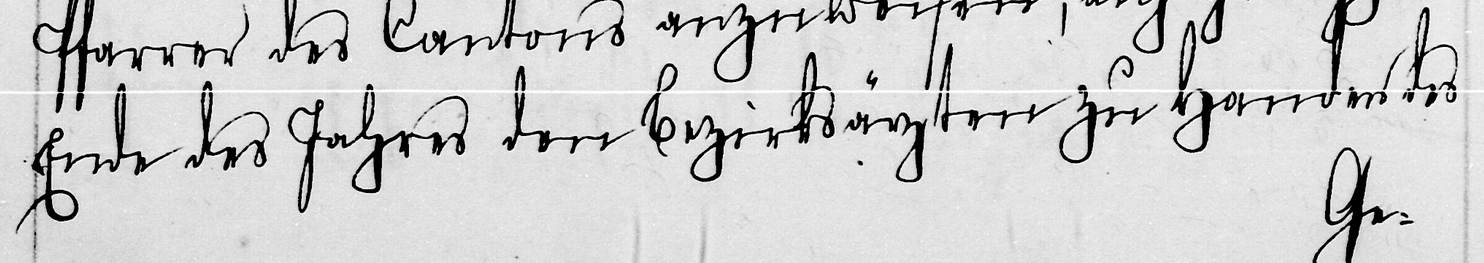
Ende des Jahres den Bezirksärzten zu Handen des
